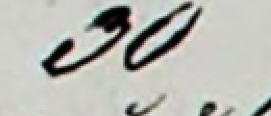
30
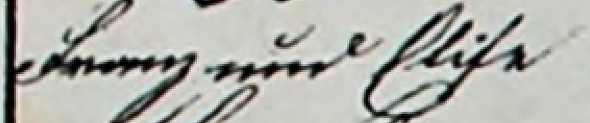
Franz und Elise
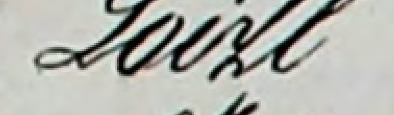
Loizl
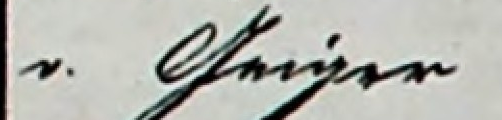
v. Geiger
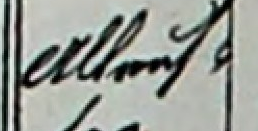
Altaus„
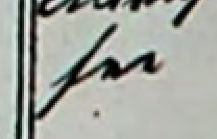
see
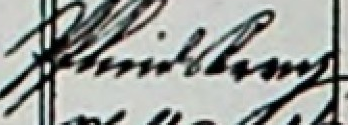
Pflindsberg
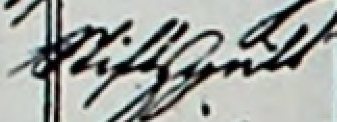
Stiftsgült
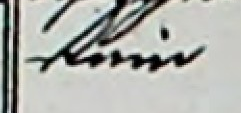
Rein
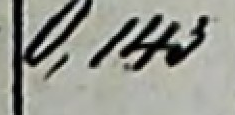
0,143
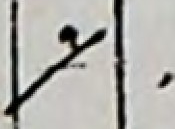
7
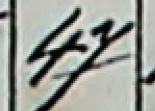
47
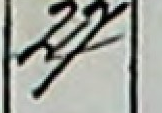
27
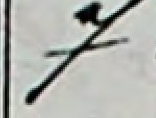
7
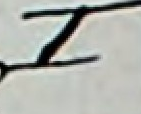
I
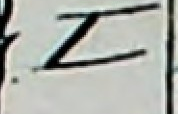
I
